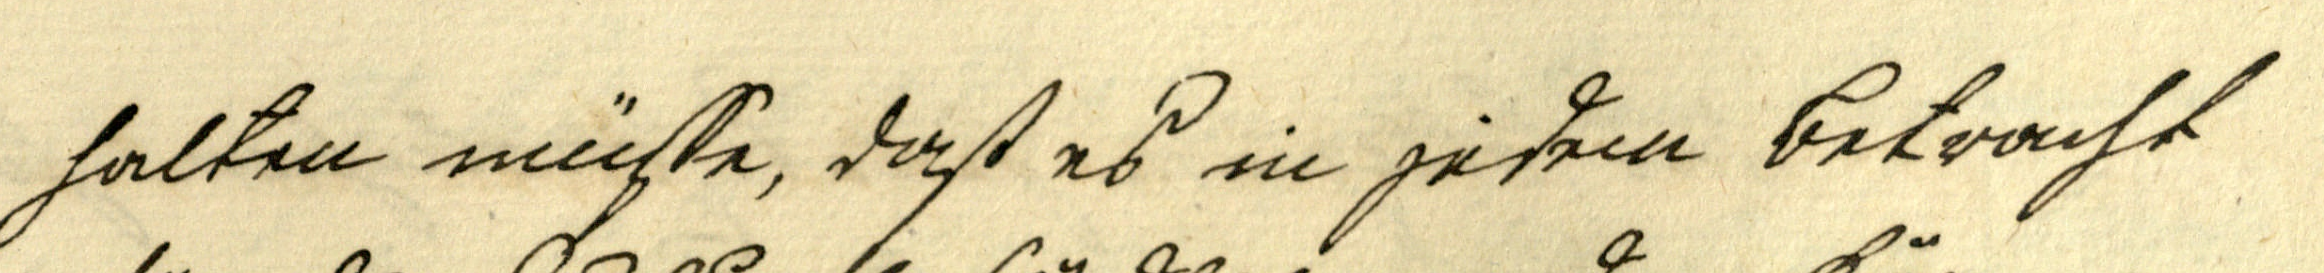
halten müsse, daß es in jedem Betracht
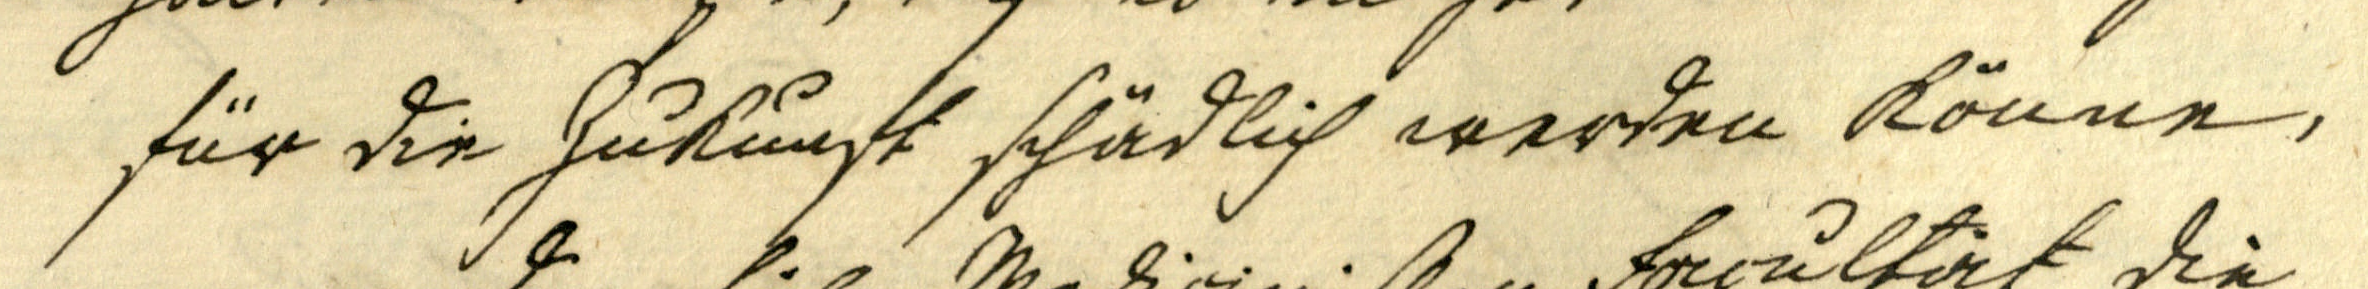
für die Zukunft schädlich werden könne,
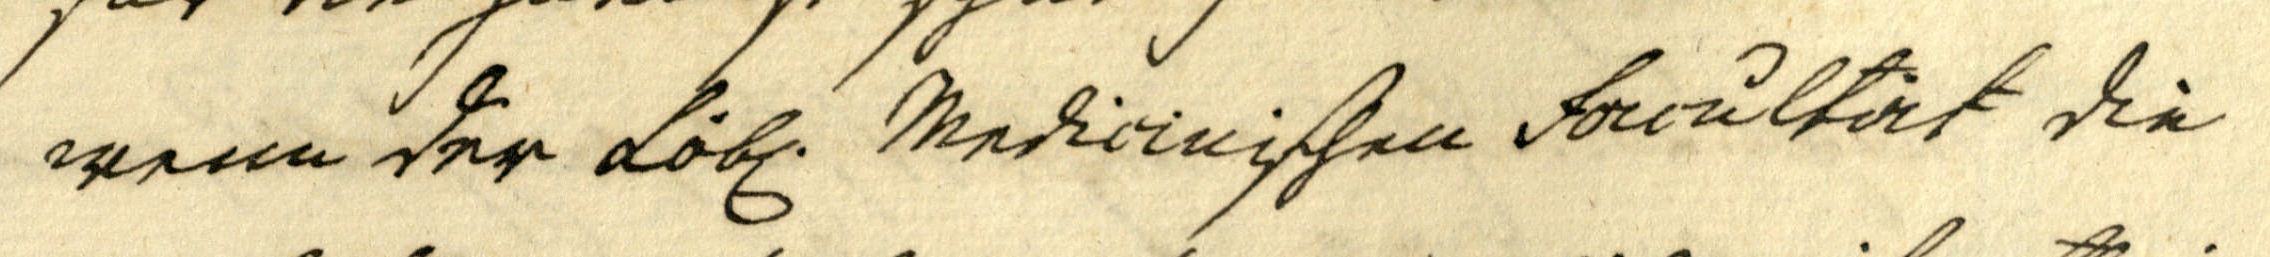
wenn der Löbl. Medicinischen Facultät die
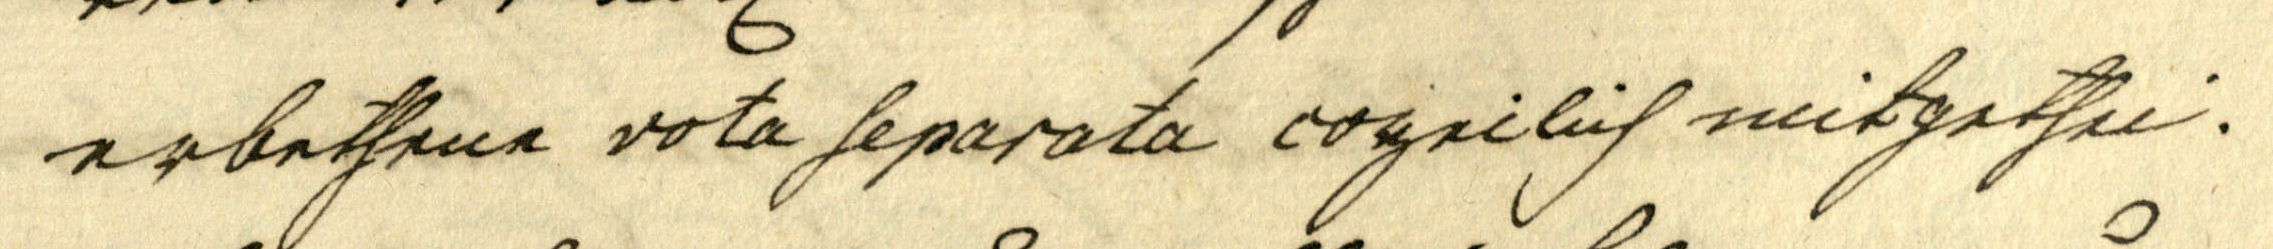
erbethene vota separata copeilich mitgethei¬
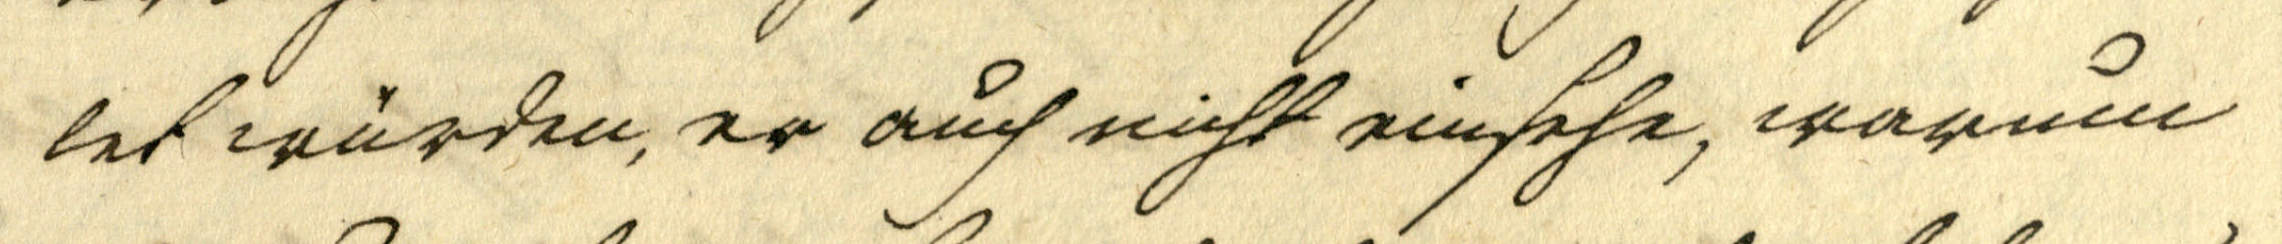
let würden, er auch nicht einsehe, warum
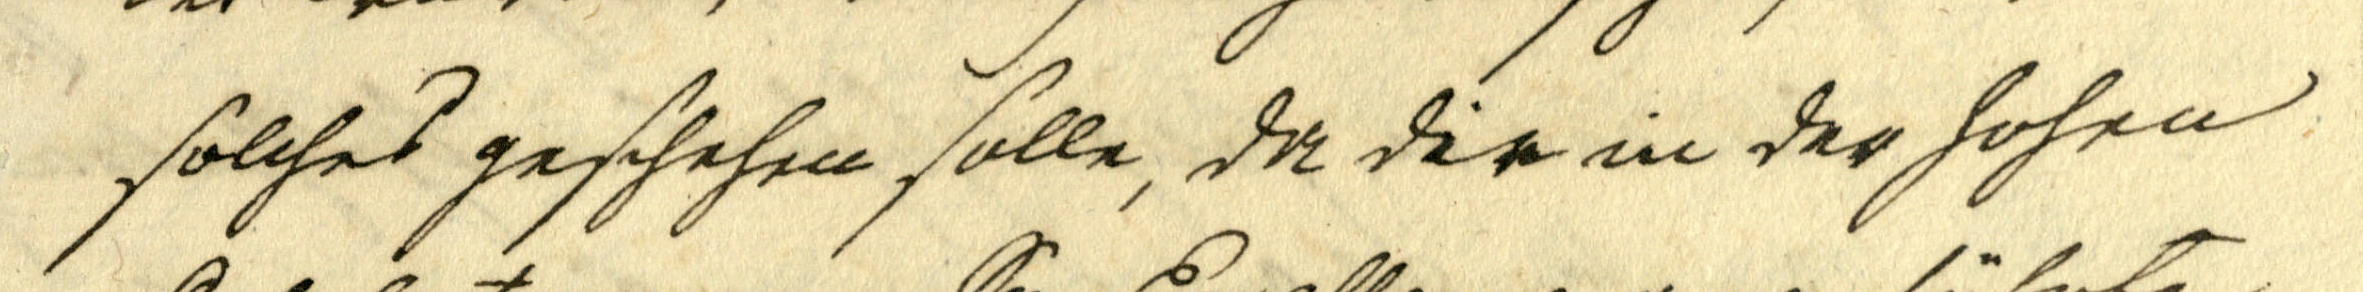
solches geschehen solle, da die in der hohen
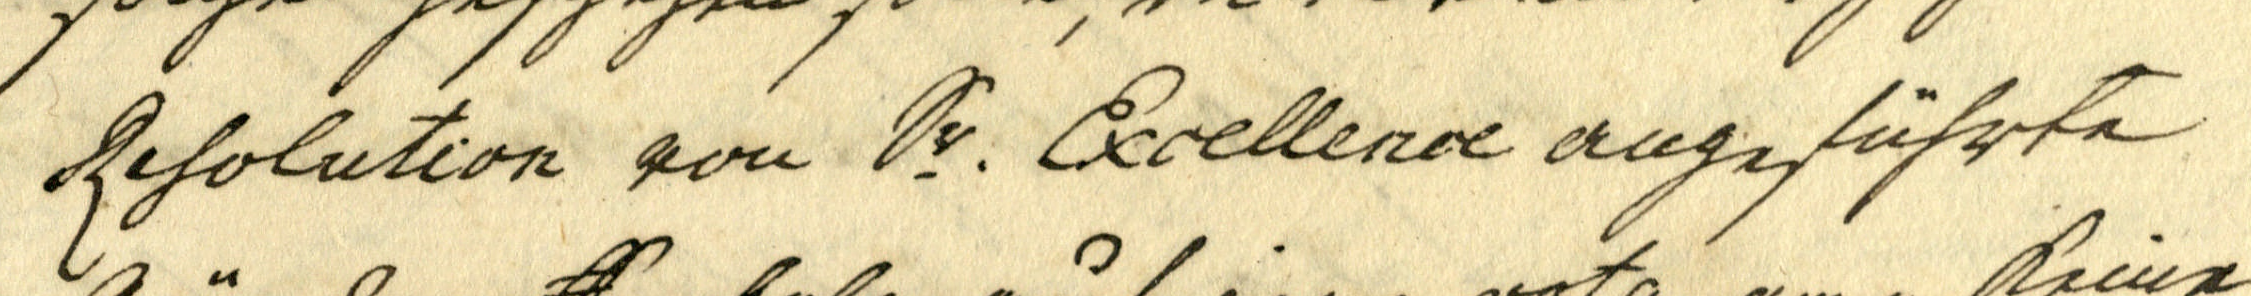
Resolution von Sr. Excellence angeführte
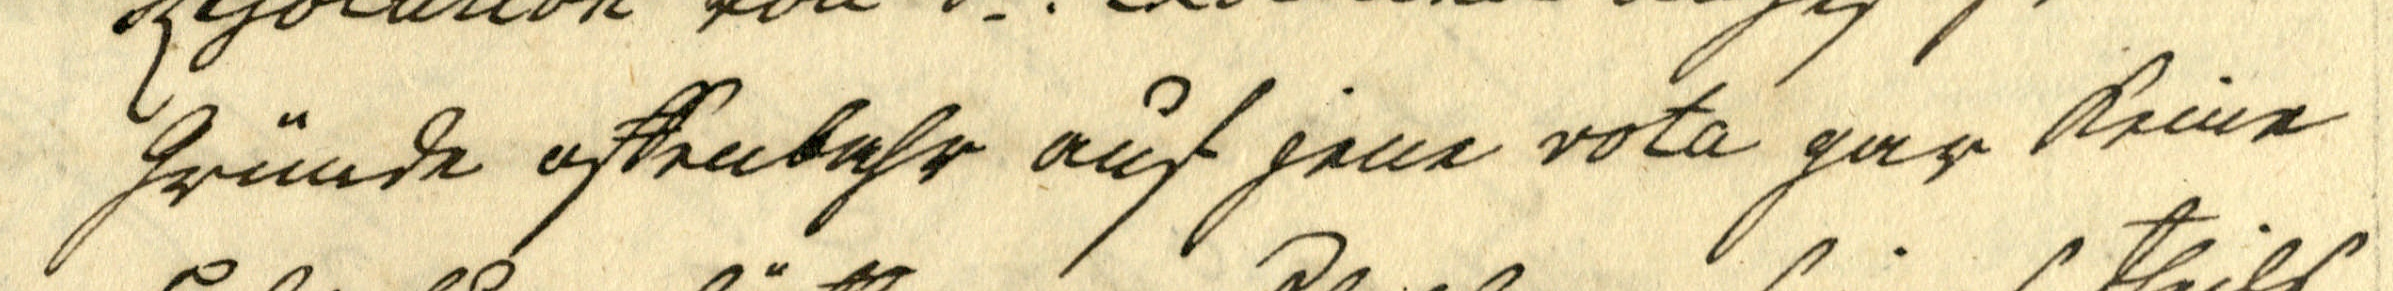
Gründe offenbahr auf jene vota gar keine
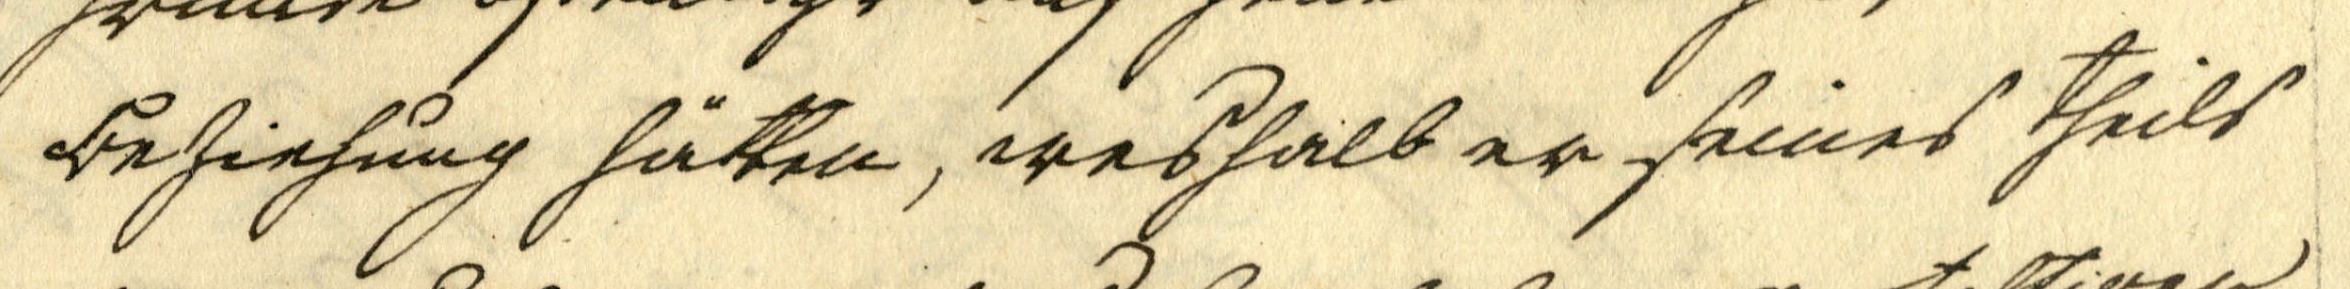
Beziehung hätten, weshalb er seines Theils
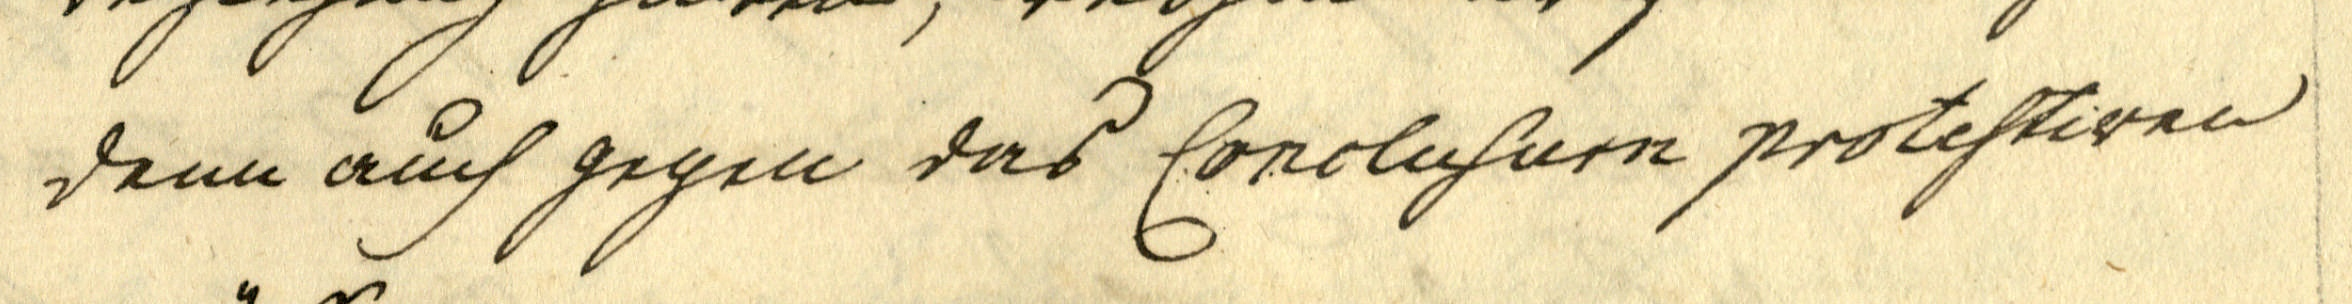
denn auch gegen das Conclusum protestiren
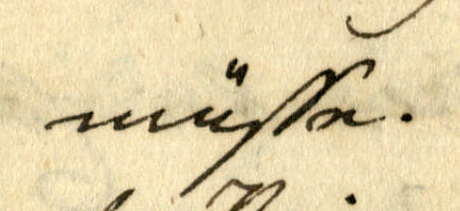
müsse.
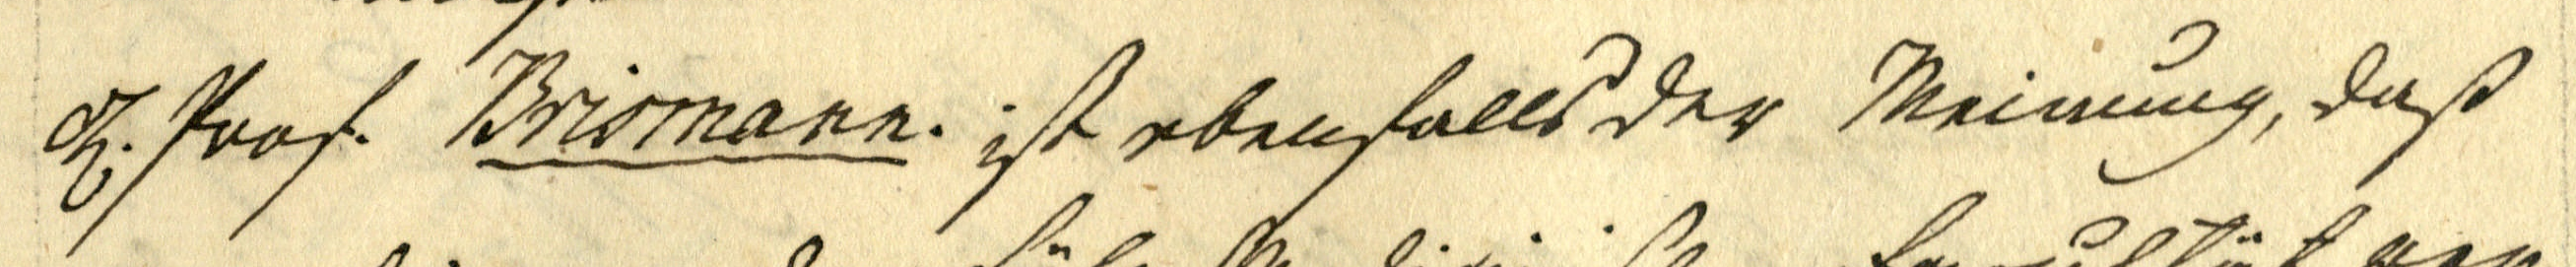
dh. Prof. Brismann. ist ebenfalls der Meinung, daß
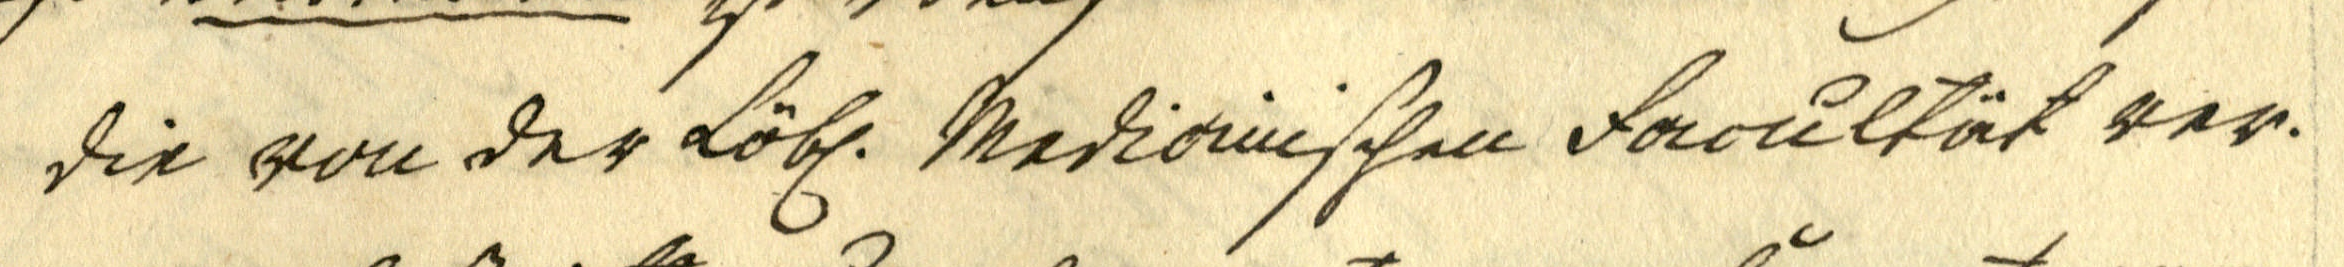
die von der Löbl. Medicinischen Facultät ver¬
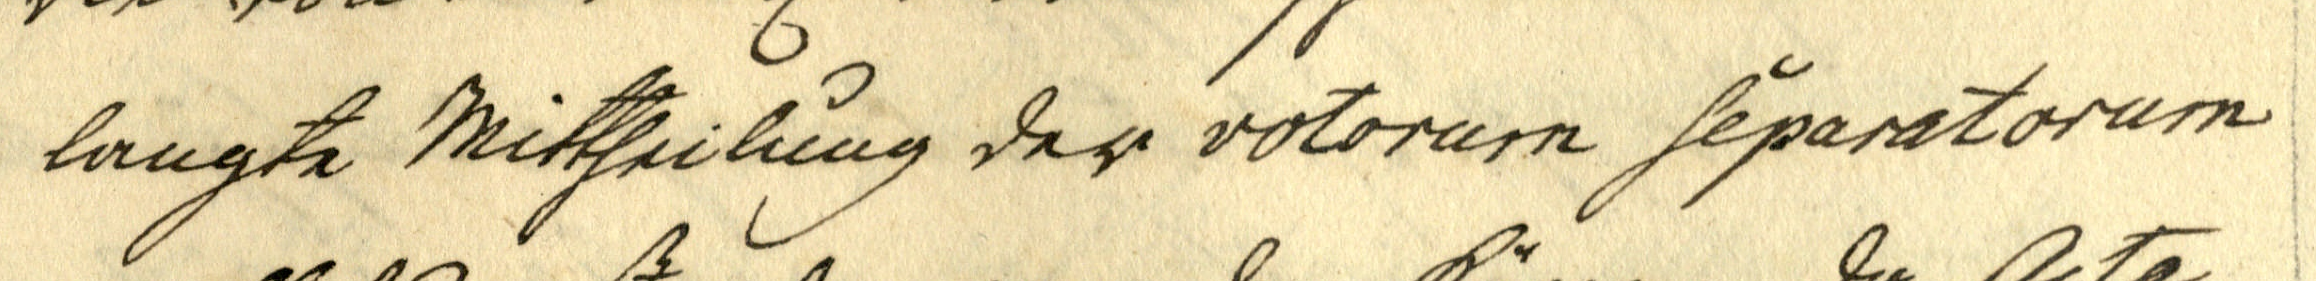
langte Mittheilung der votorum separatorum
